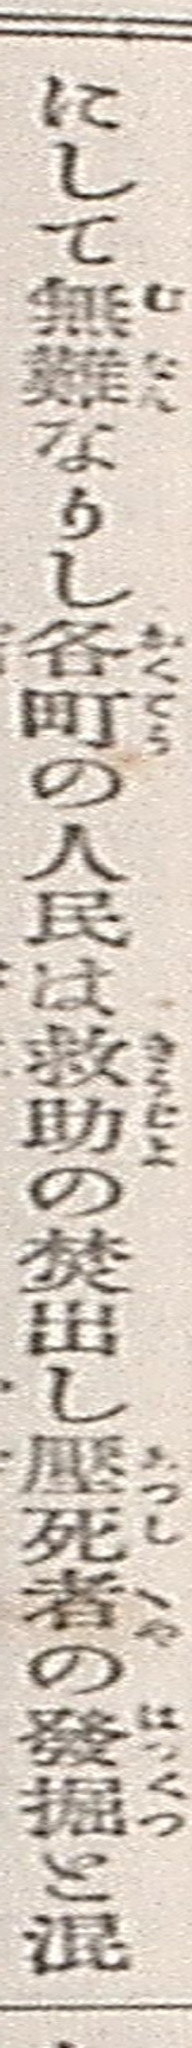にして無難なりし各町の人民は救助の焚出し壓死者の発掘と混
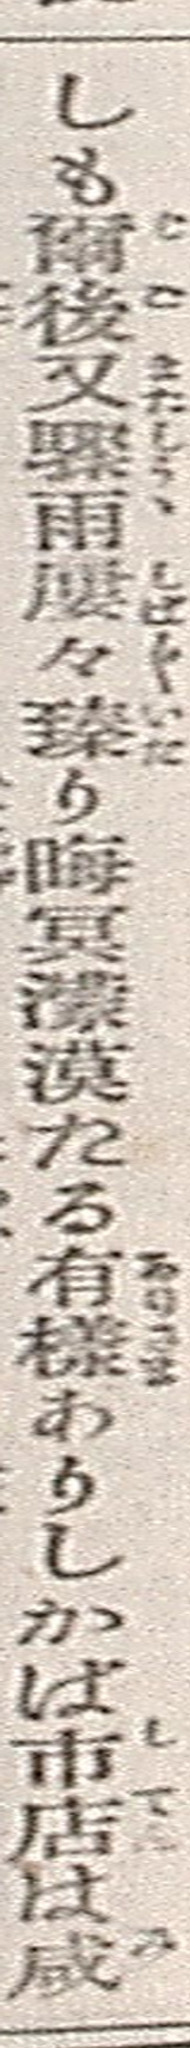しも爾後又驟雨屡々臻り晦冥濛莫たる有様ありしかば市店は咸
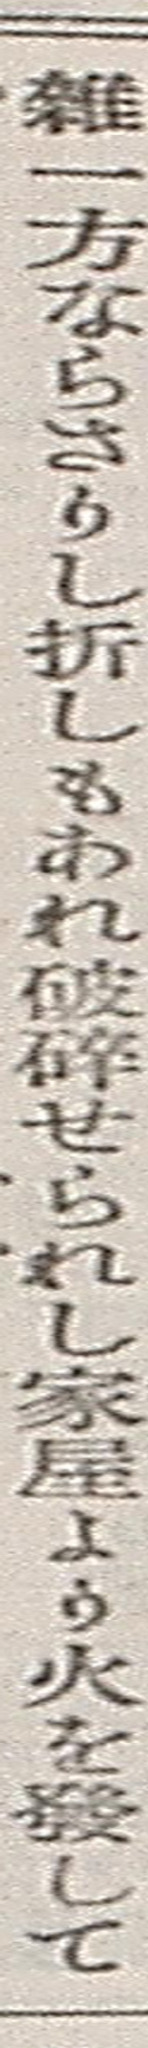雑一方ならさりし折しもあれ破砕せられし家屋より火を発して
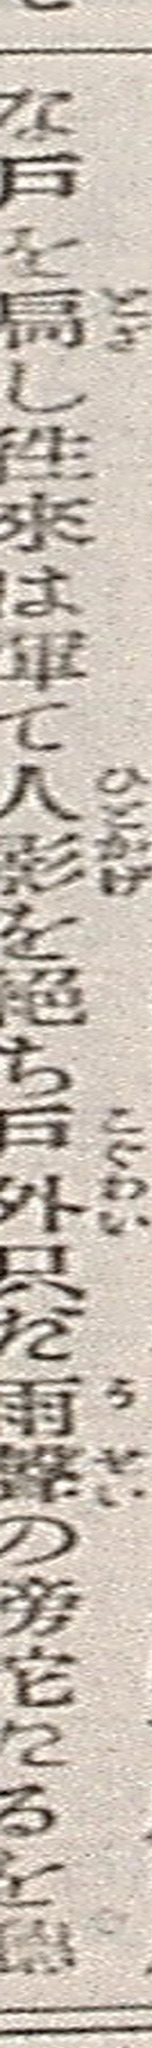な戸を扁し往来は渾て人影を絶ち戸外只だ雨声の滂沱たるを聴
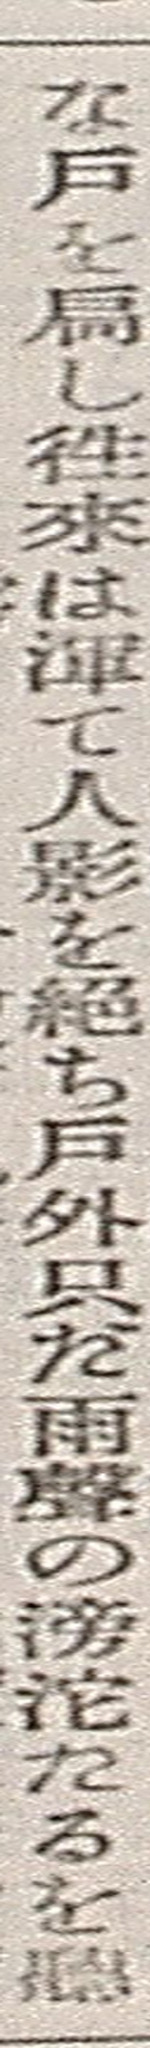な戸を扁し往来は渾て人影を絶ち戸外只だ雨声の滂沱たるを聴
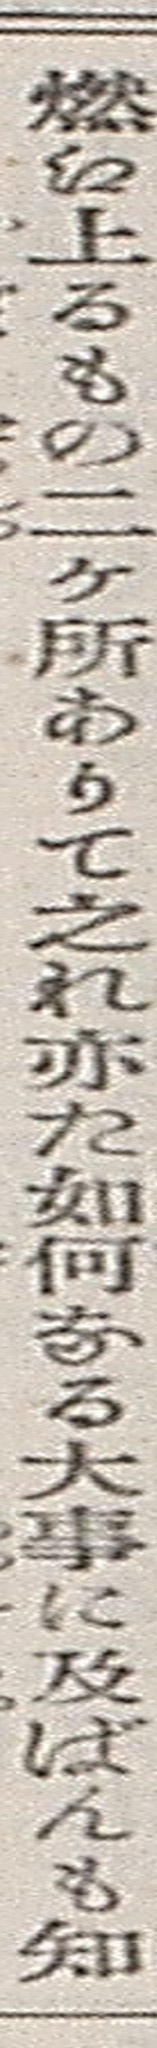燃え上るもの二ヶ所ありて之れ亦た如何なる大事に及ばんも知
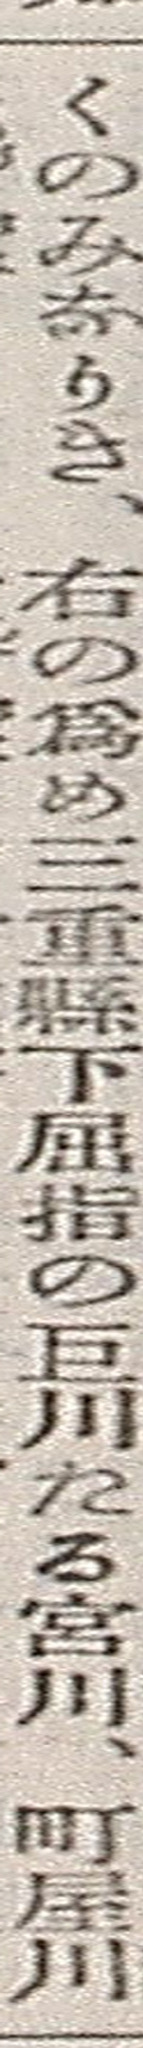くのみなりき、右の為め三重県下屈指の巨川たる宮川、町屋川
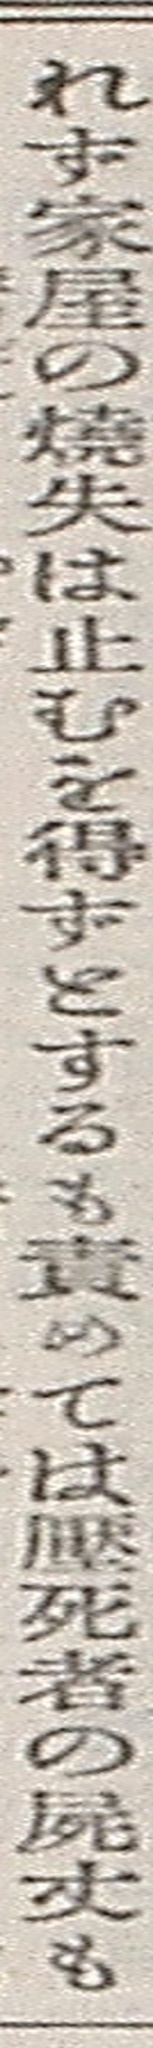れず家屋の焼失は止むを得ずとするも責めては壓死者の屍丈も
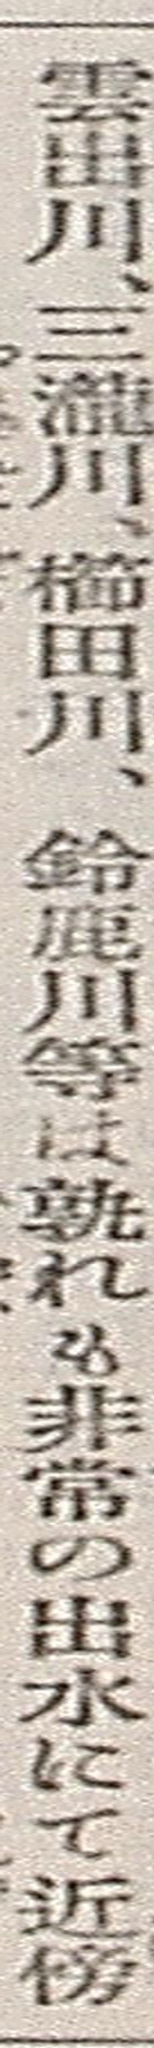雲出川、三瀧川、櫛田川、鈴鹿川等は孰れも非常の出水にて近傍
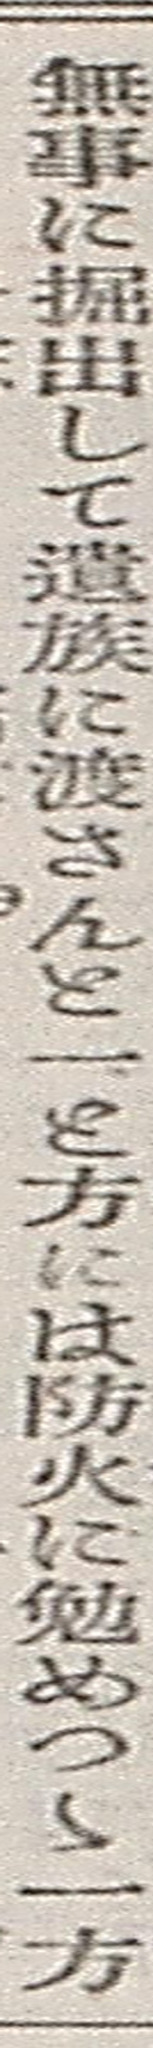無事に堀出して遺族に渡さんと一と方には防火に勉めつゝ一方
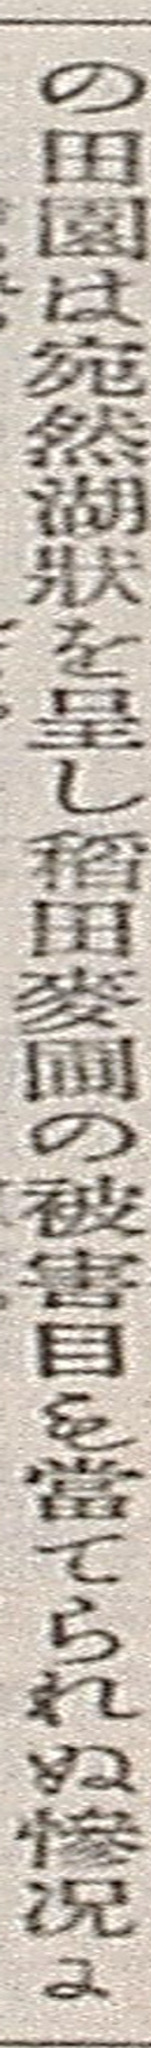の田園は宛然湖状を呈し稲田麦圃の被害目も当てられぬ惨況に
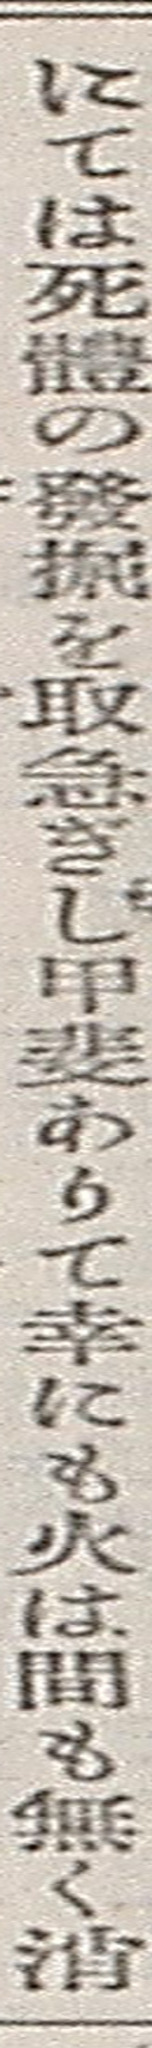にては死体の発掘を取急ぎし甲斐ありて幸にも火は間も無く消
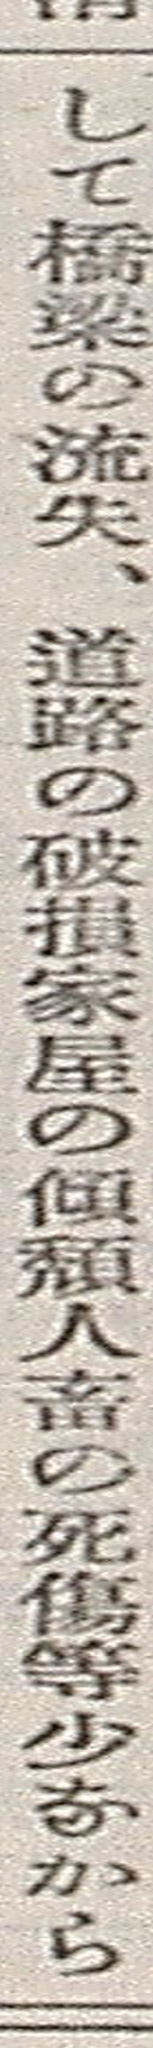して橋梁の流失、道路の破損家屋の傾頽人畜の死傷等少なから
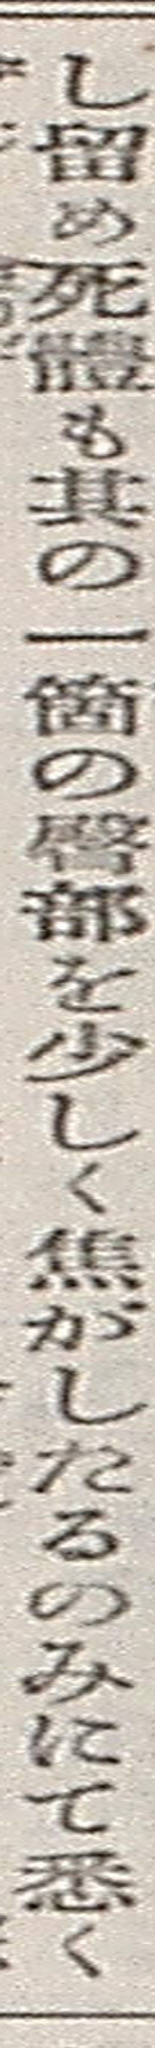し留め死体も其の一箇の臀部を少しく焦がしたるのみにて悉く
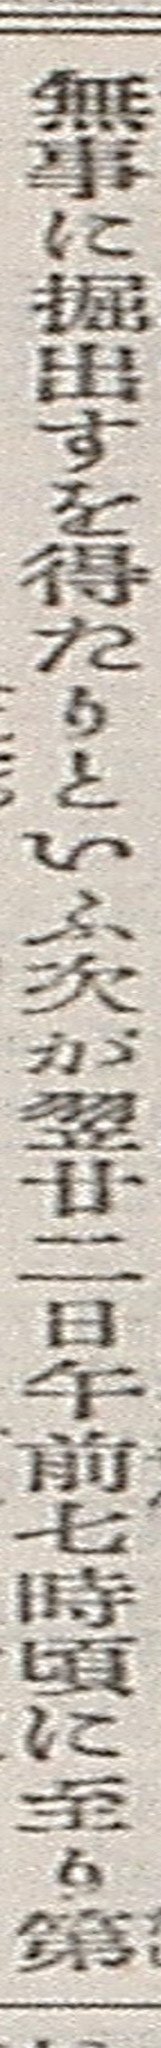無事に堀出すを得たりといふ次が翌廿二日午前七時頃に至り第
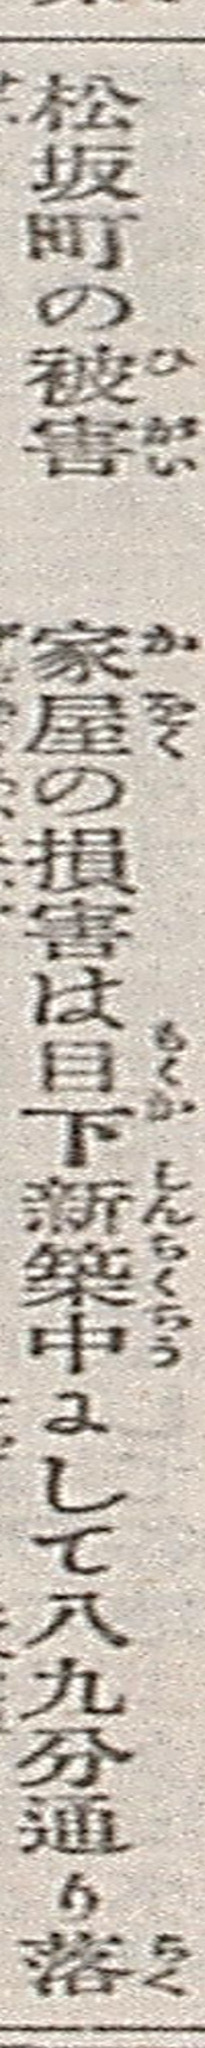松坂町の被害家屋の損害は目下新築中にして八九分通り落
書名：風俗畫報臨時増刊第百二十八號　洪水被害録（下）
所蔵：東京大学地震研究所図書室 Earthquake Research Institute Library, The University of Tokyo, JAPAN
